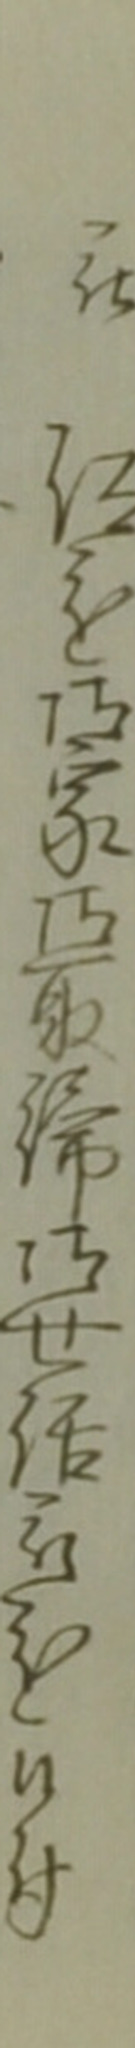被仰進御家御取締御世話被進候付
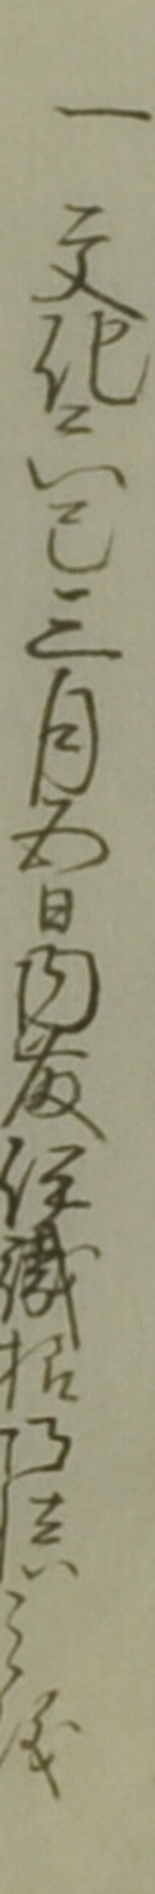一文化六巳三月五日内藤伊織様御慎之儀
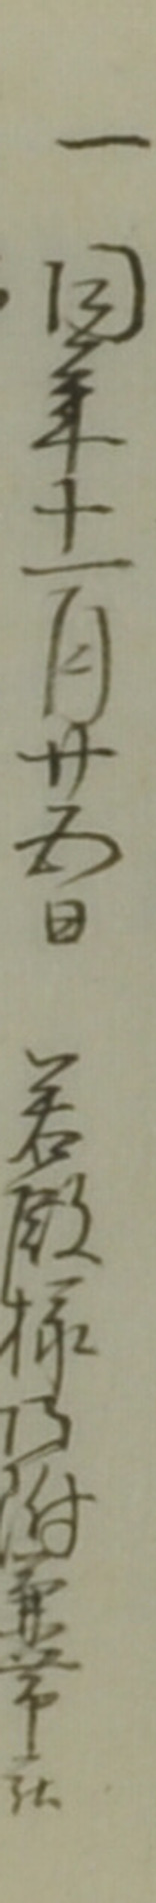一同年十一月廿五日若殿様御附兼帯被
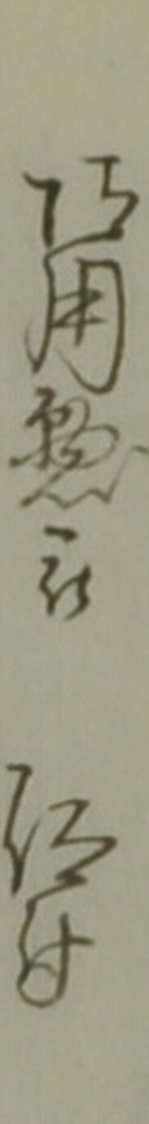御用懸被仰付
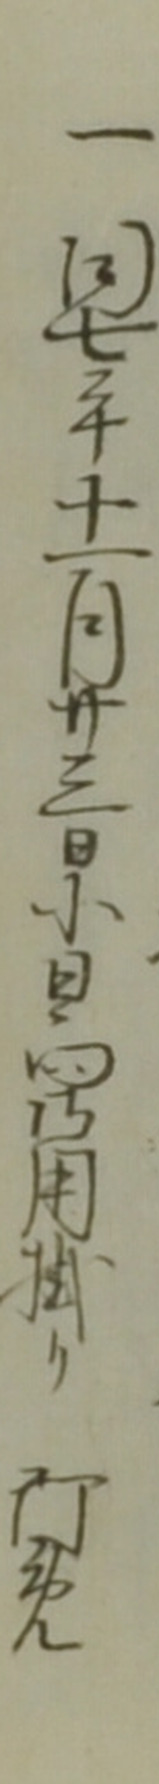一同七午十一月廿三日小日向御用掛リ御免
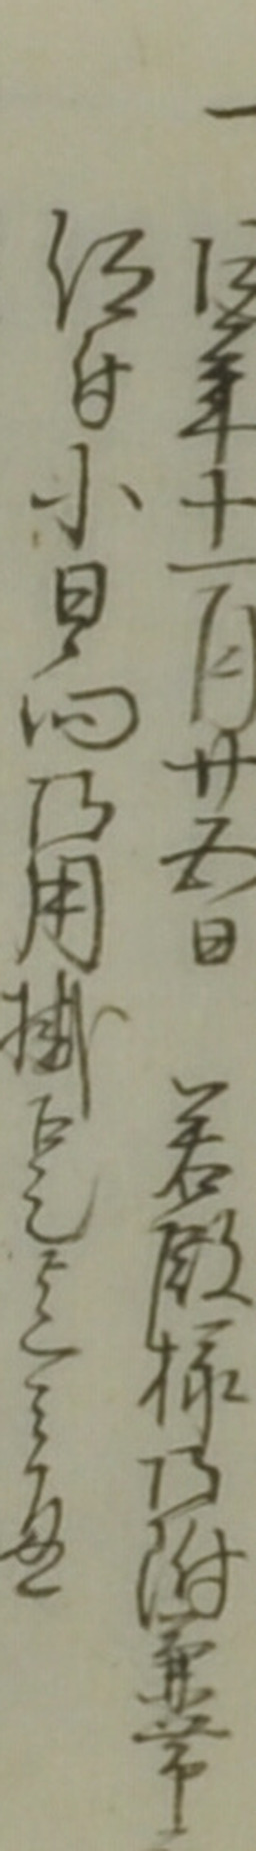仰付小日向御用掛是迄之通
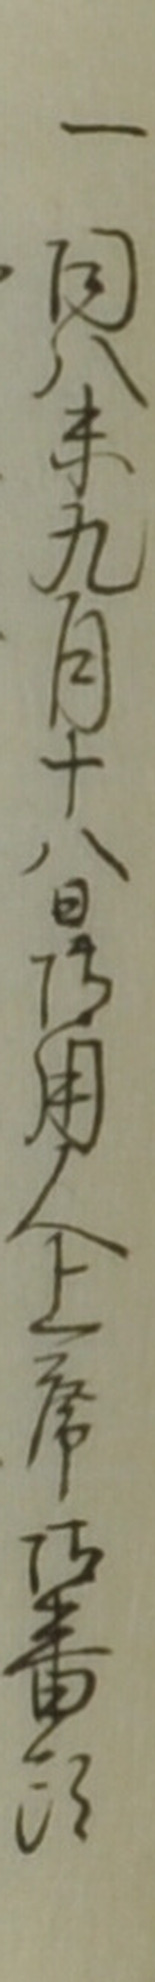一同八未九月十八日御用人上席御番頭
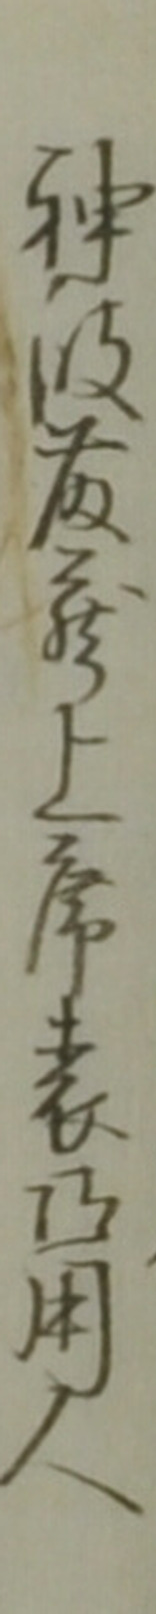神波藤蔵上席表御用人
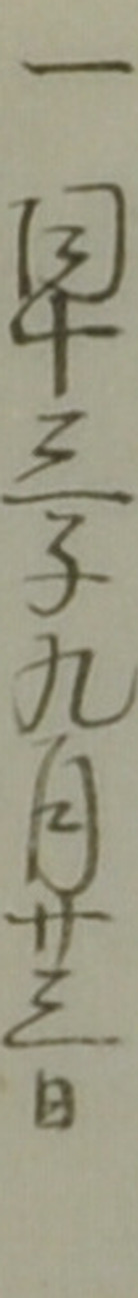一同十三子九月廿三日
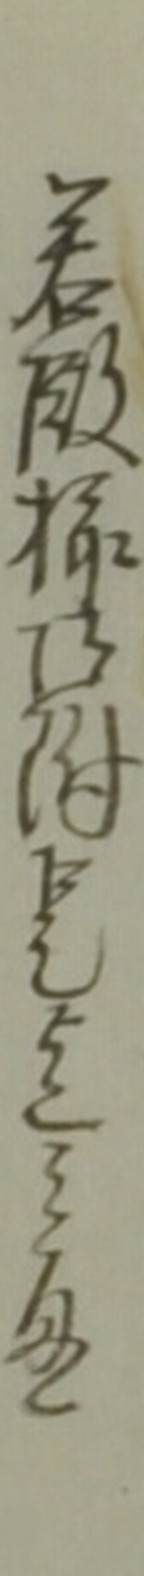若殿様御附是迄之通
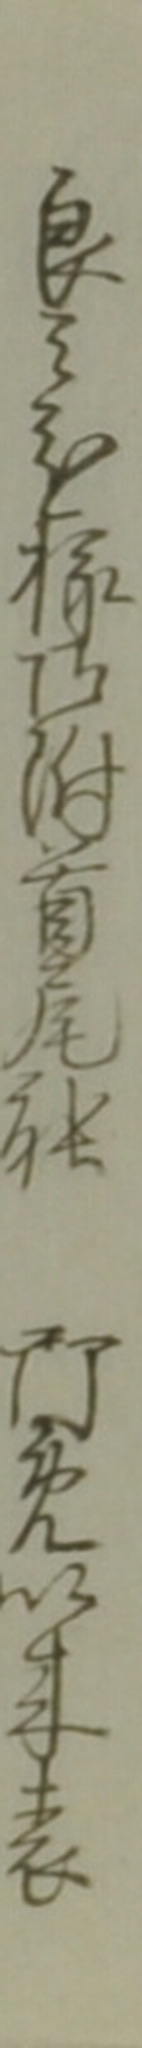良之進様御附首尾能御免以来表
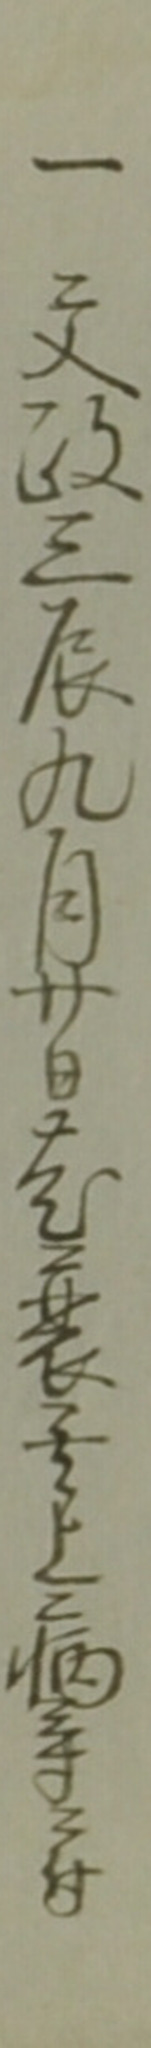一文政三辰九月廿日老衰其上病気ニ付
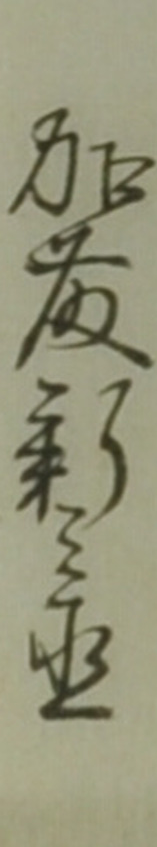加藤新之丞

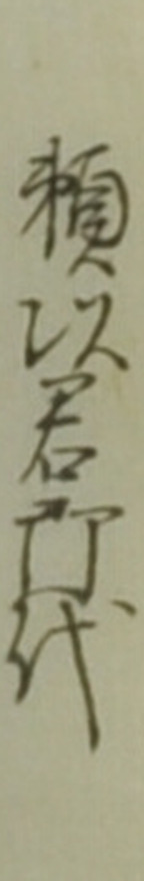頼以君御代
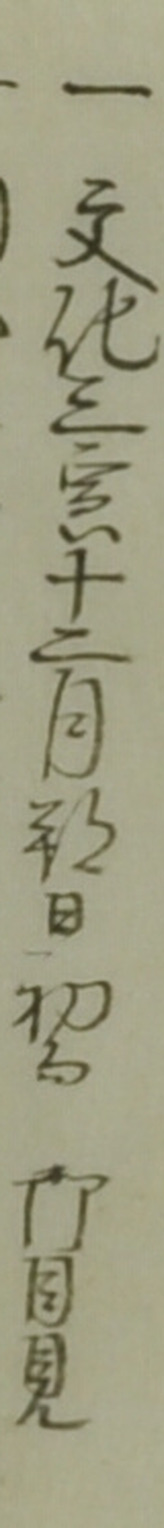一文化三寅十二月朔日初而御目見
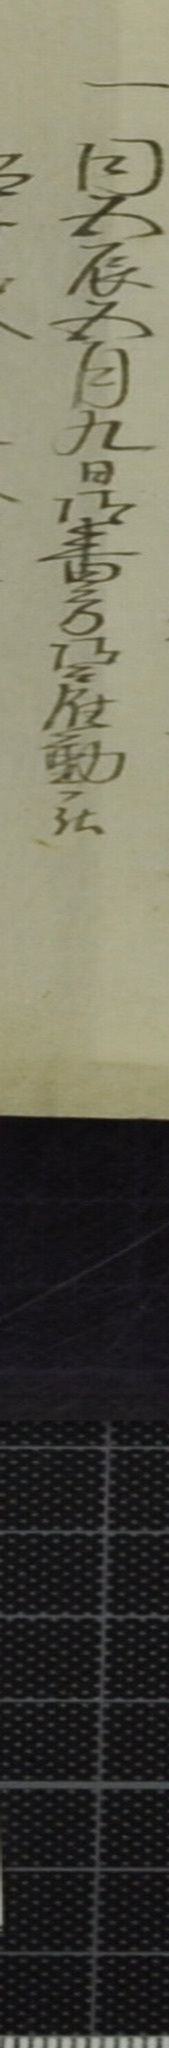一同五辰五月九日御番方御雇勤被
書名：給人諸士勤仕録（三）
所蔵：伊那市立高遠町図書館・合同会社AMANE
